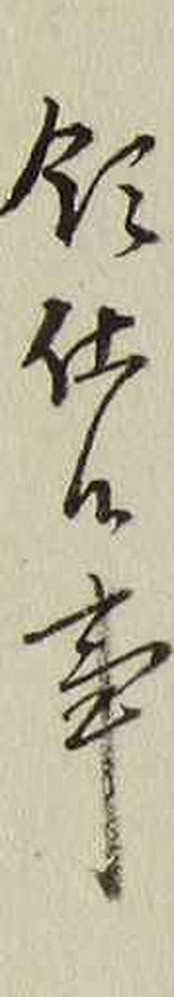領仕候事
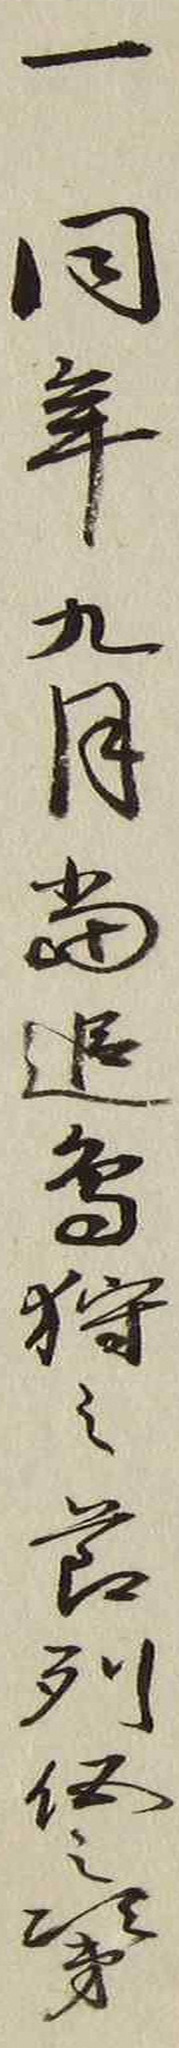一同年九月当追鳥狩之節列伍之次第
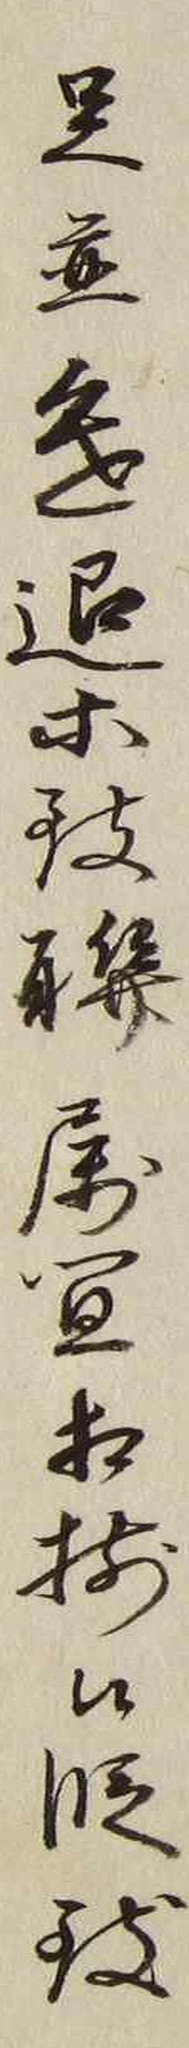足並進退等致聯属宜相揃候段致

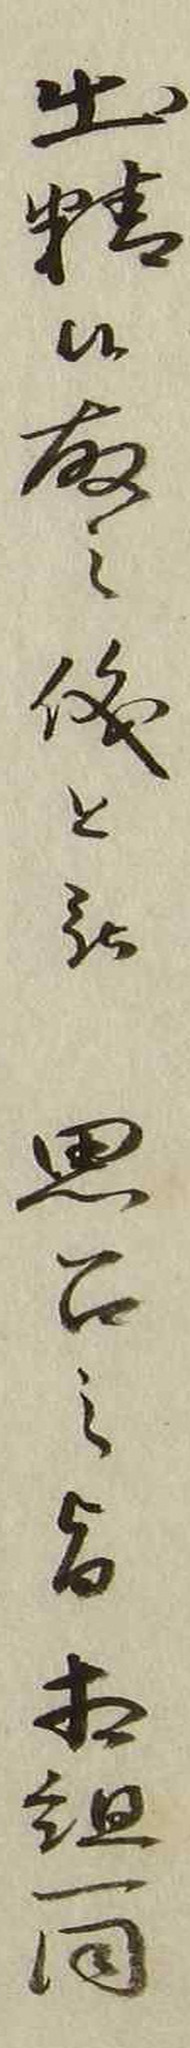出精候故之儀と被思召之旨相組一同
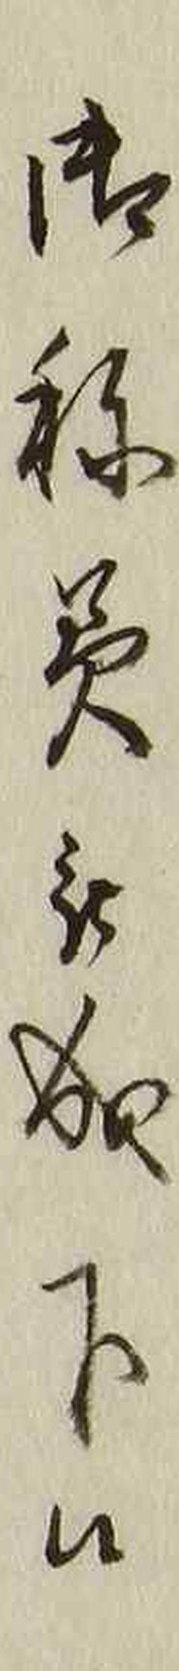御称美被成下候
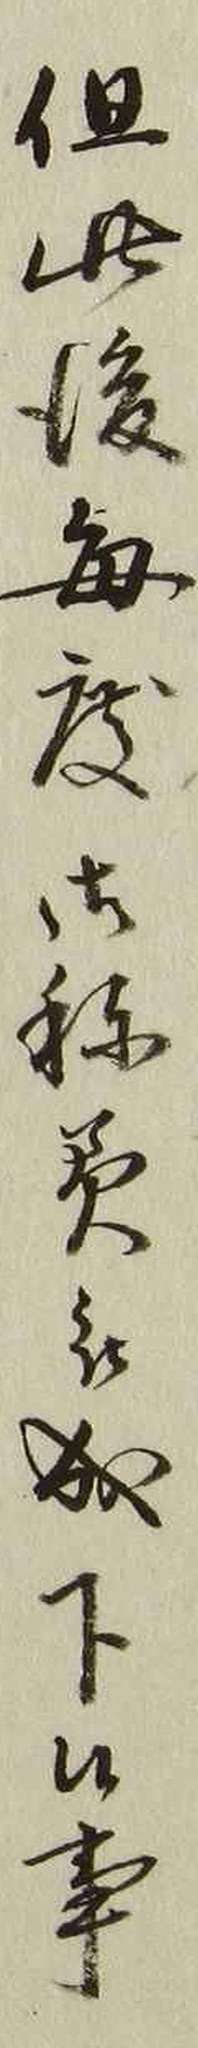但此後毎度御称美被成下候事
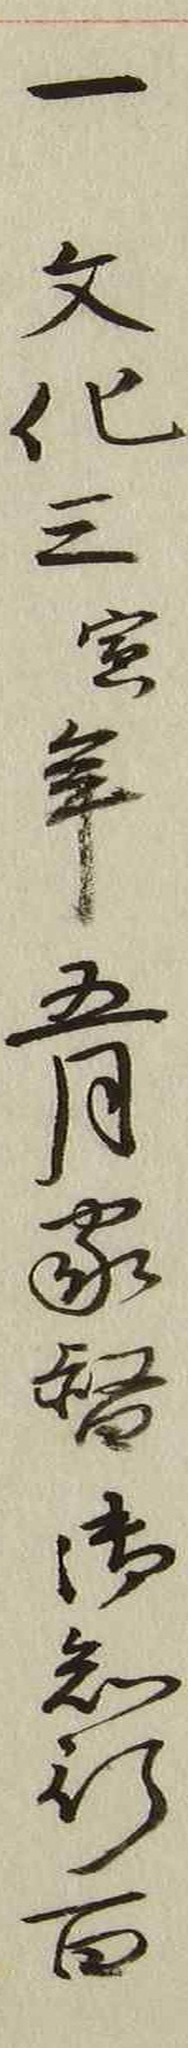一文化三寅年五月家督御知行百
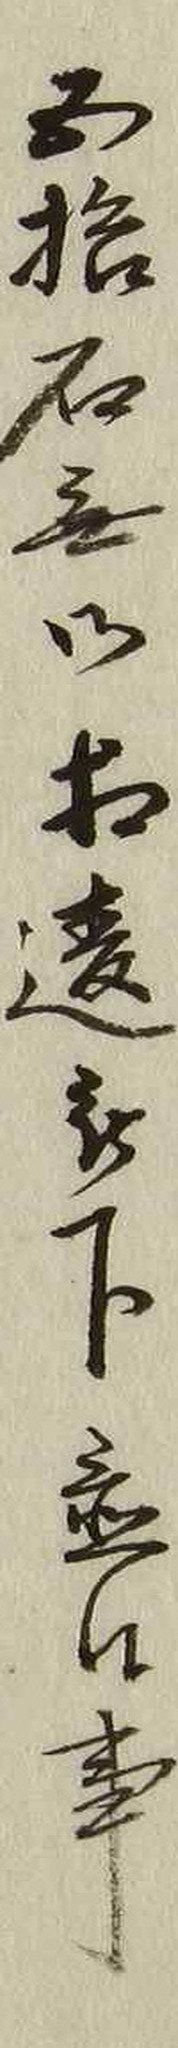五拾石無御相違被下置候事
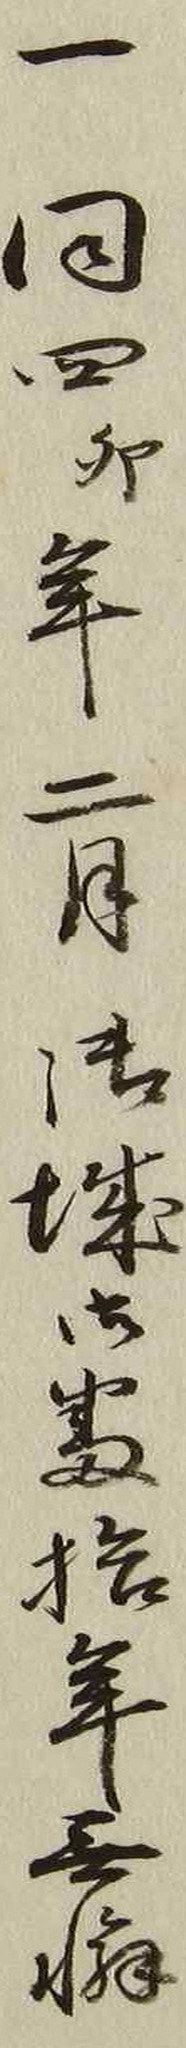一同四卯年二月御城御番拾年無懈
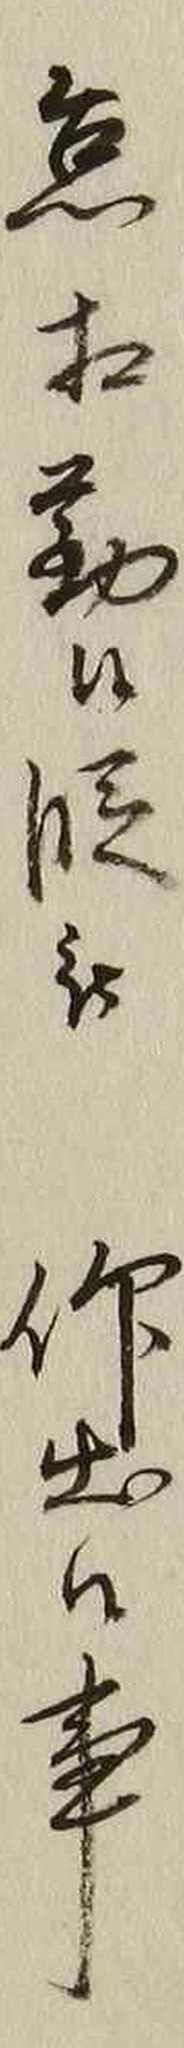怠相勤候段被仰出候事
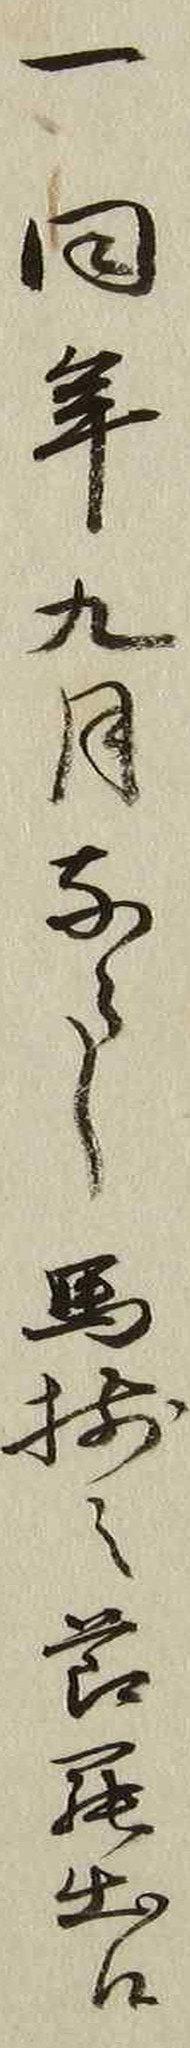一同年九月ならし馬揃之節罷出候
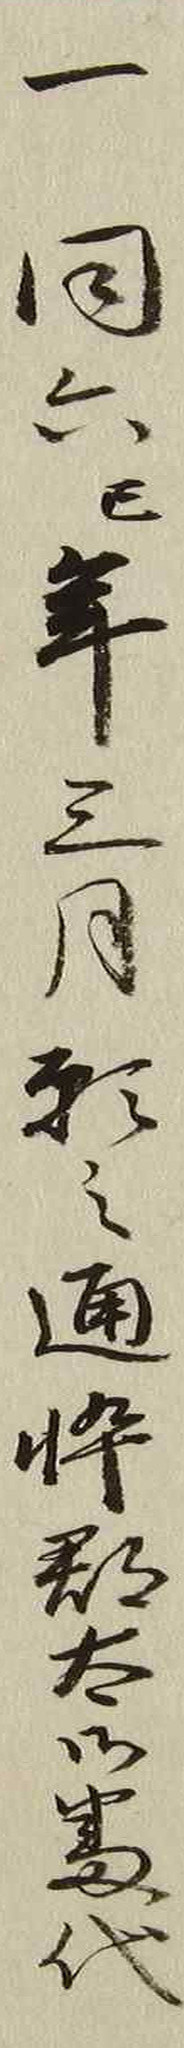一同六年巳三月願之通忰郡太御番代
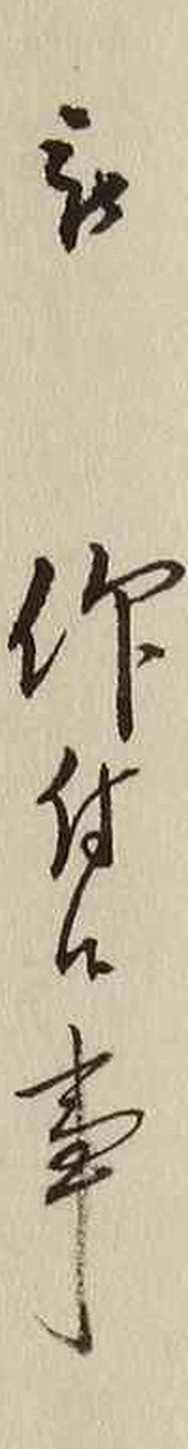被仰付候事
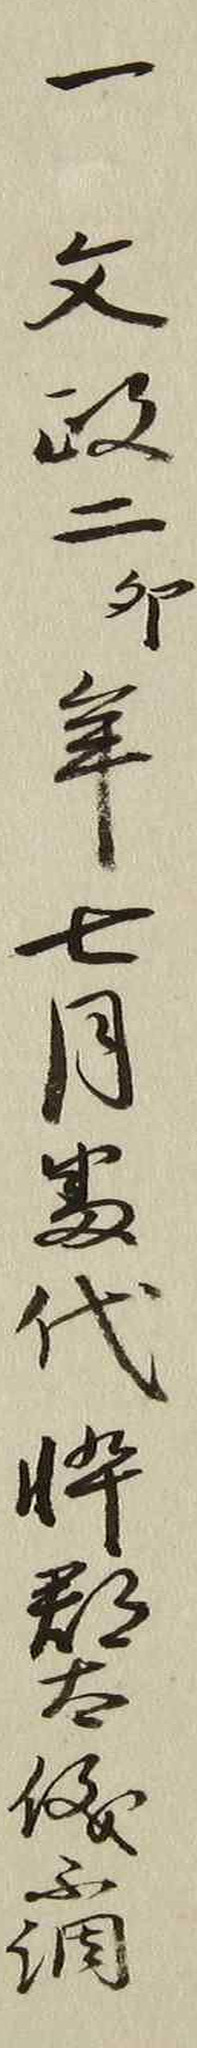一文政二卯年七月番代忰郡太儀不調
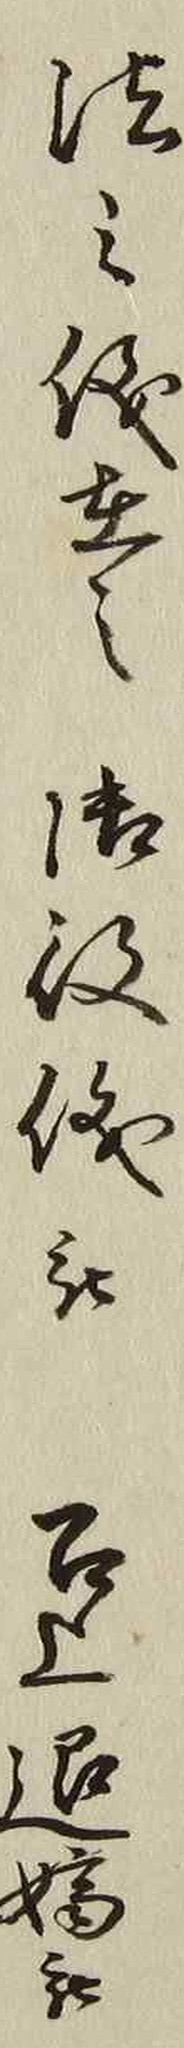法之儀在之御役儀被召上退嫡被
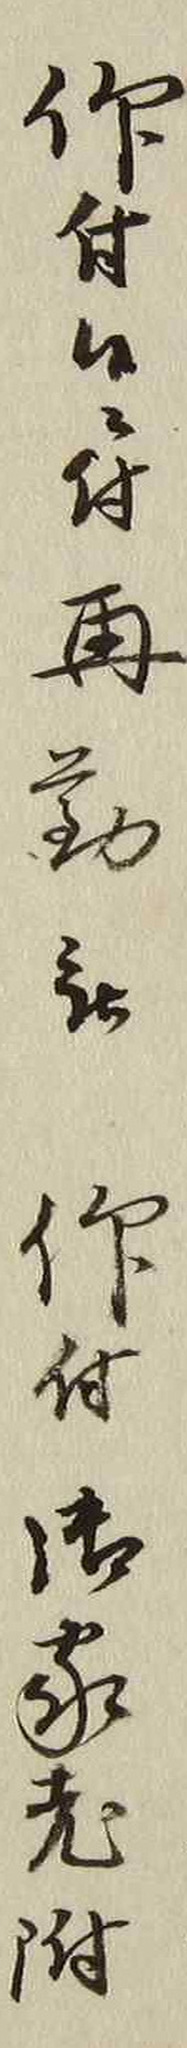仰付候ニ付再勤被仰付御家老附
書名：諸士系譜　巻之149　そ之部2
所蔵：会津若松市立会津図書館
